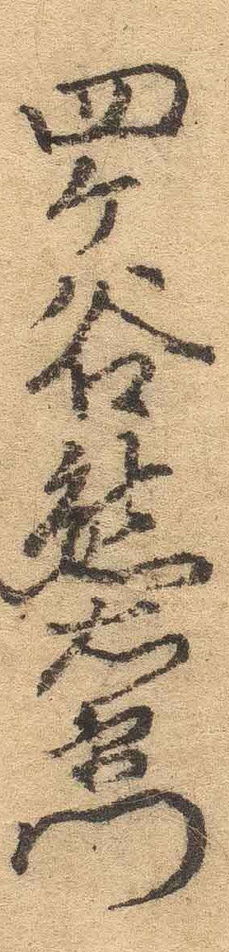同同四ケ谷熊右衛門
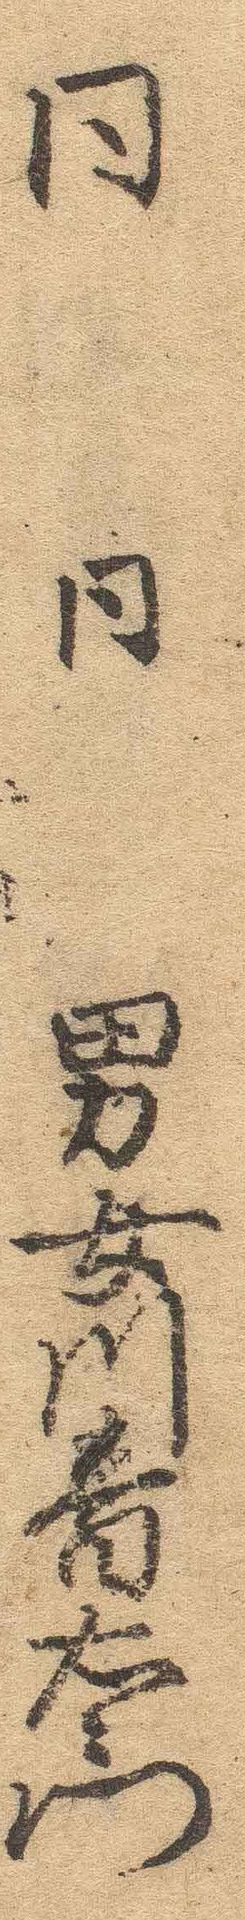同同男女川音右衛門
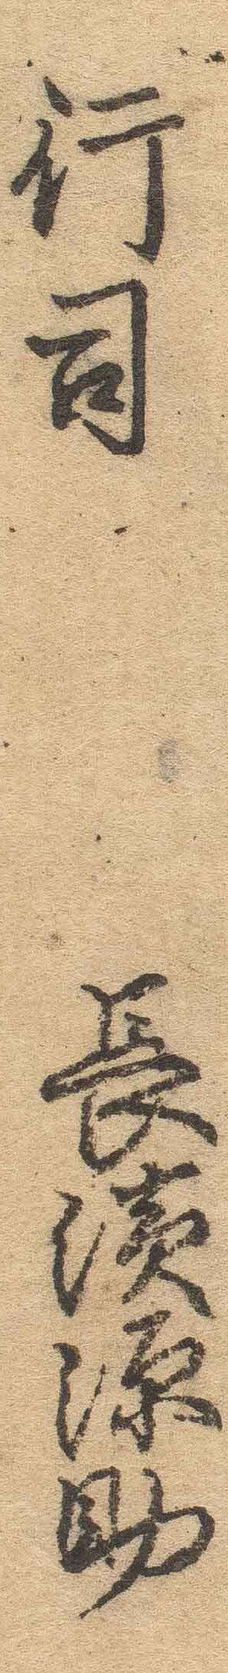行司長濱源助
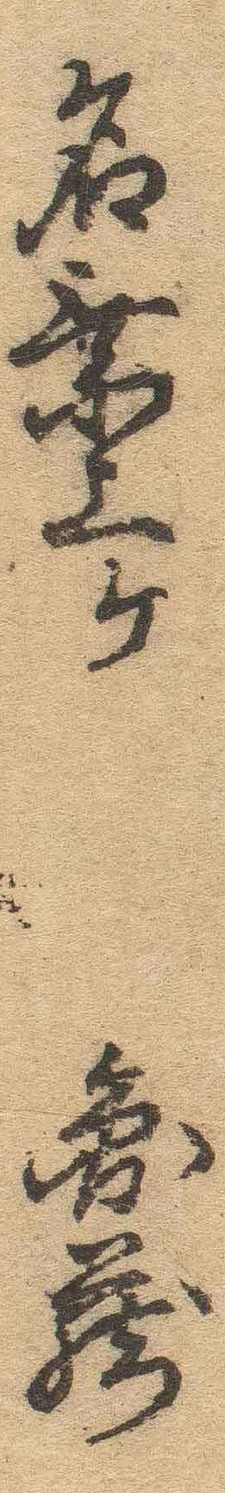名乗上ケ圓蔵
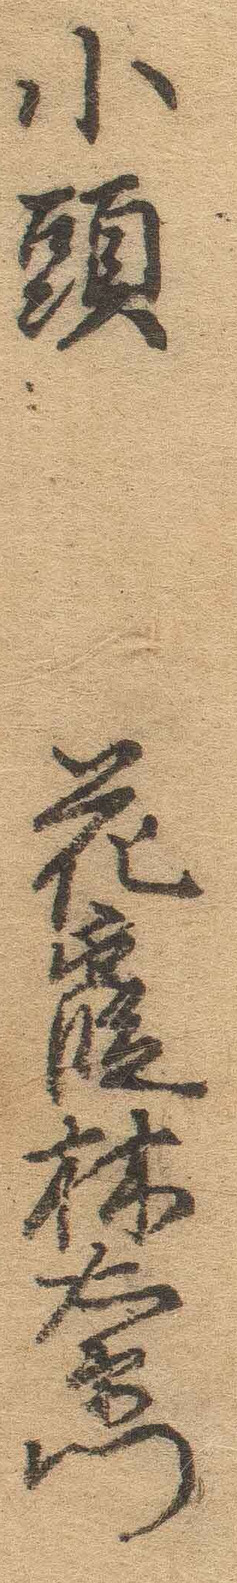小頭花霞林右衛門
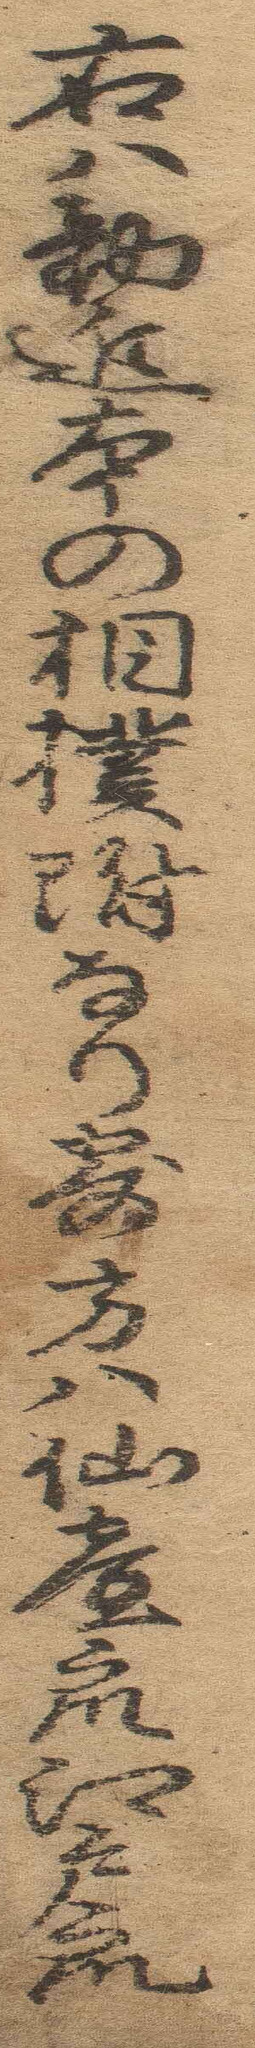右ハ勧進本の相撲附なり寄方ハ仙台衆江戸衆
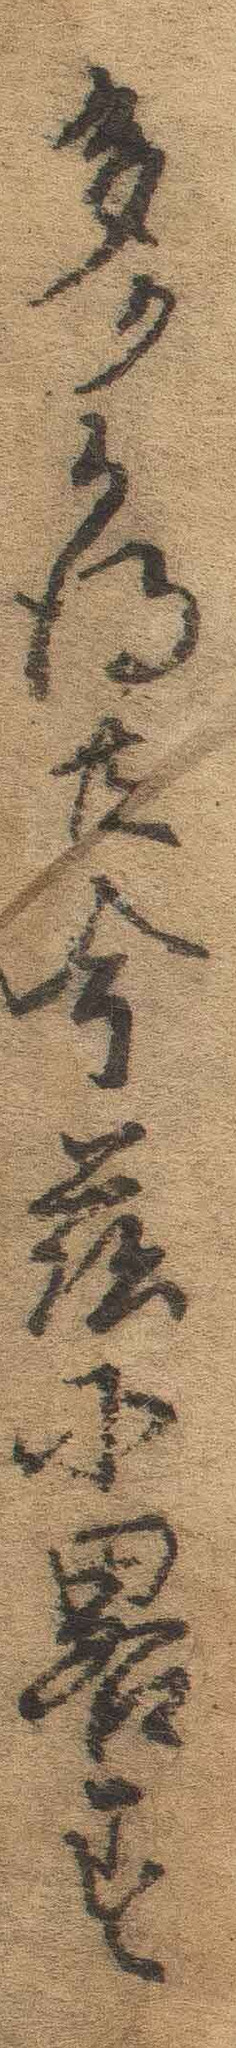多ク候得共今茲に畧す

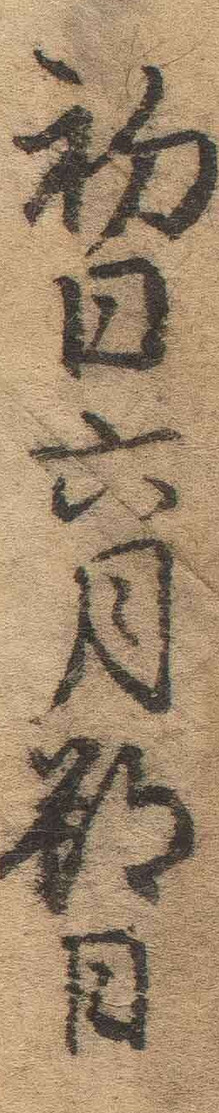初日六月朔日
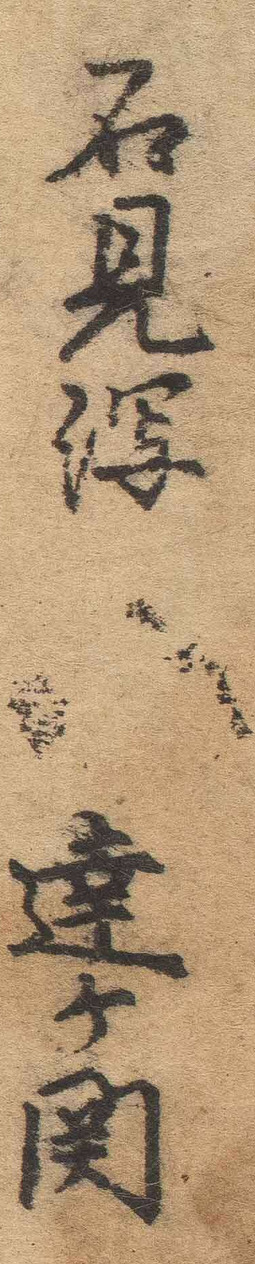石見潟達ケ関
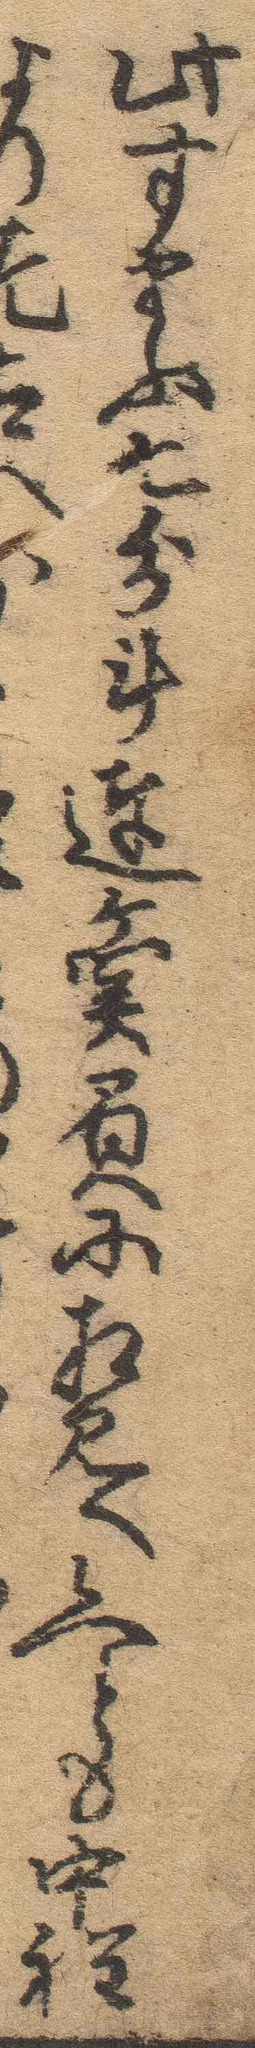此すまふ七分斗達ケ関負に相見へ候へとも中程
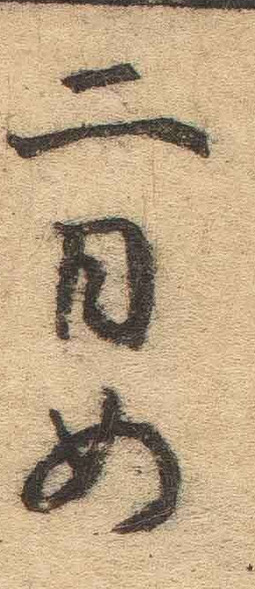二日め
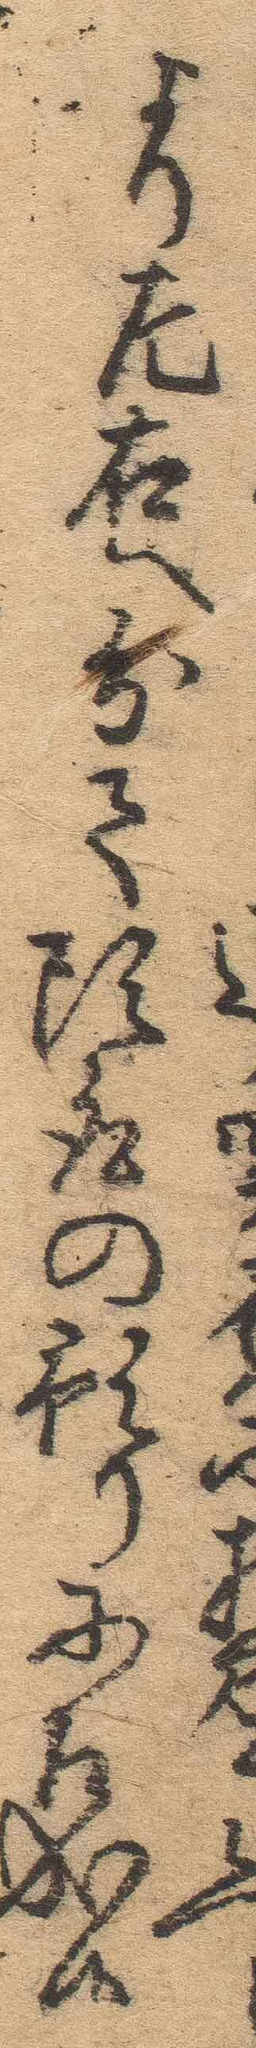より左右へ分て頭取の預りに被成候
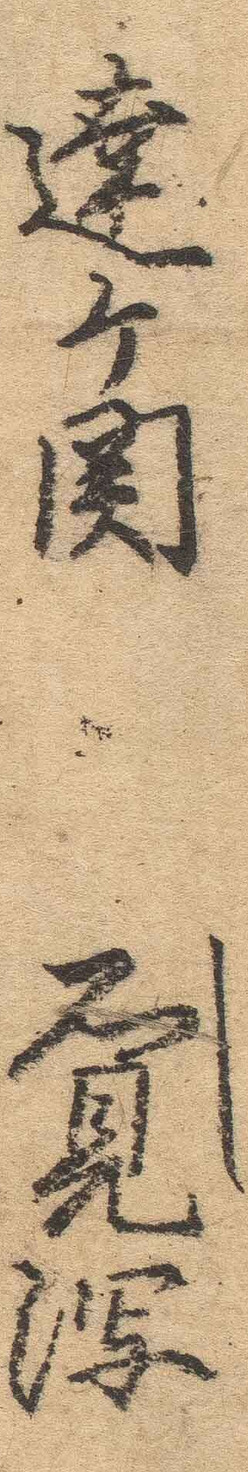達ケ関岩見潟
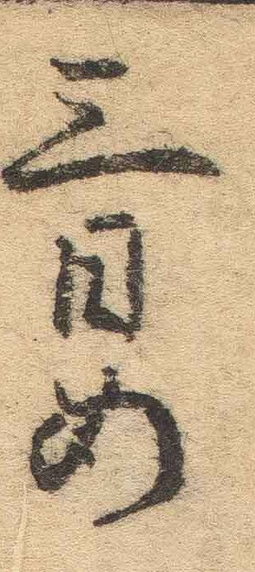二日め
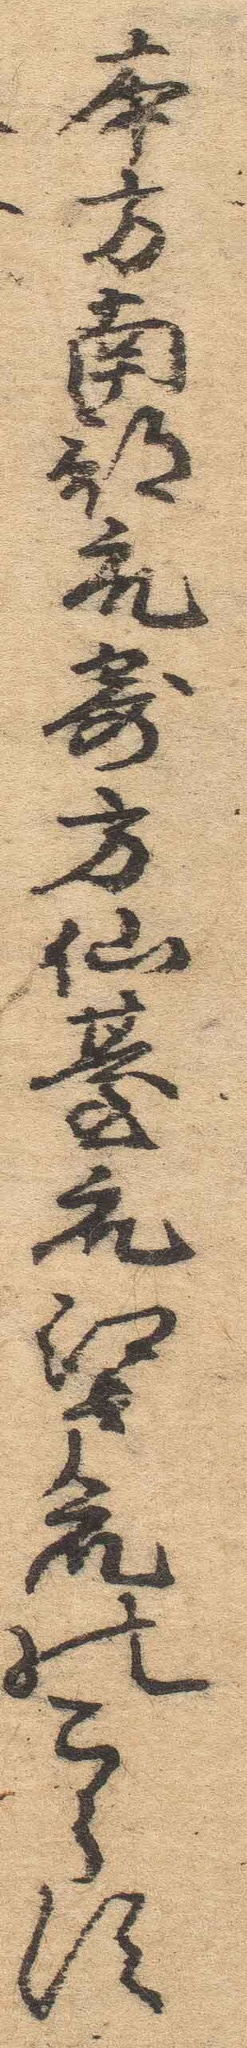三日め東方南部衆寄方仙台衆江戸衆のこらす
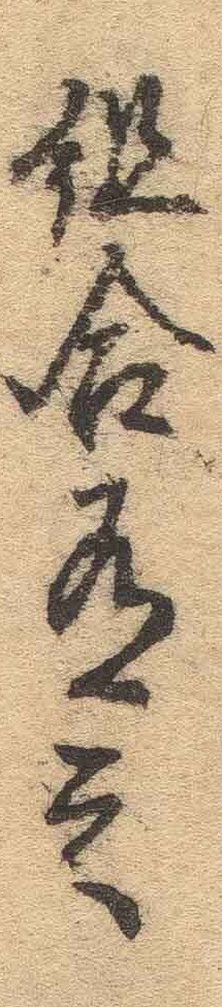組合有之
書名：古今相撲大全
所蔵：東京学芸大学附属図書館 国文学研究資料館
